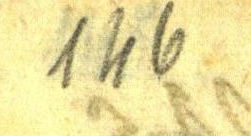146
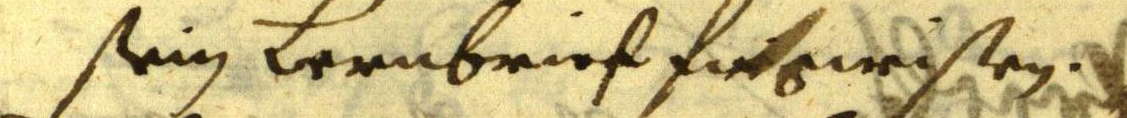sein Lernbrief fir gwisen.
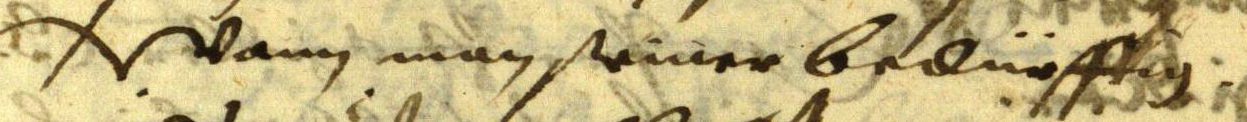Wann man seiner bedürfftig.
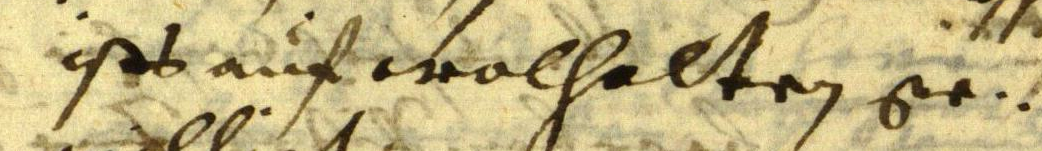ists aūf wolhalten ge¬
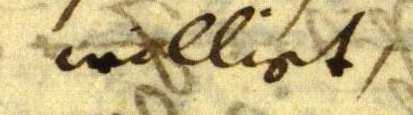willigt,
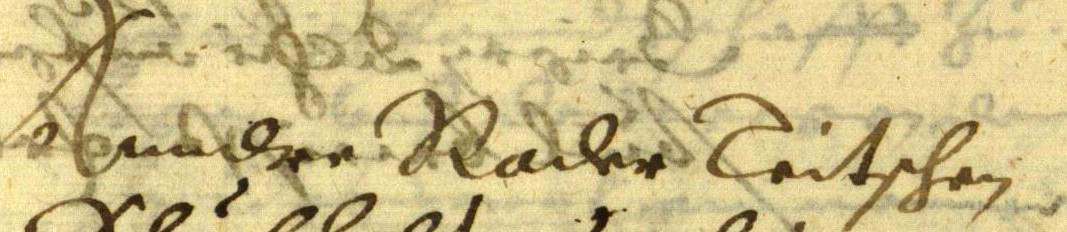Anndre Rader Teitschen
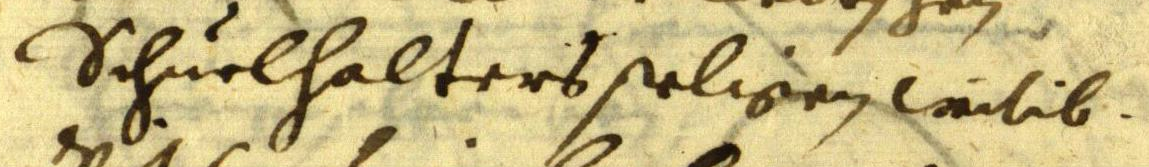Schūelhalters seligen witib.
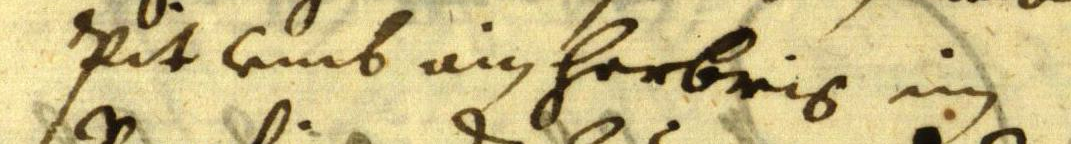Pit vmb ain herbrig im
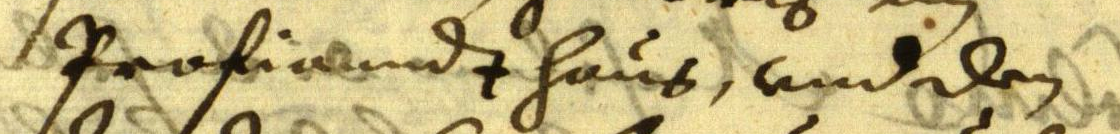Profianndthaūs, vnd den
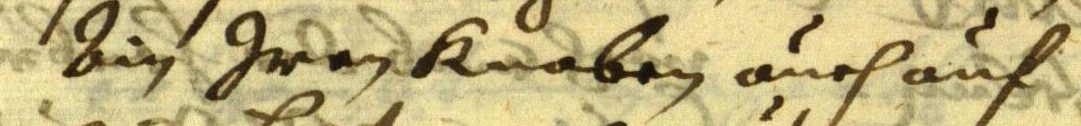Ain Iren Knaben aūch aūf
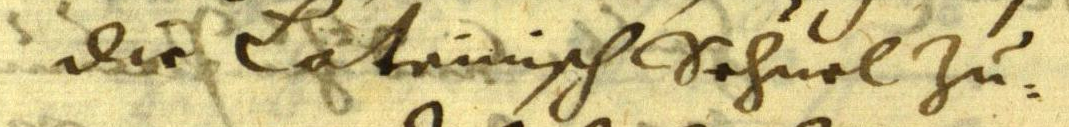die Lateinisch Schūel Zū¬
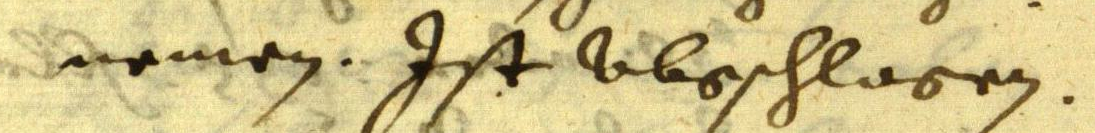nemen. Ist Abgschlagen.
